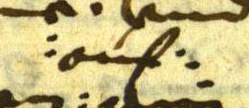:aūf:
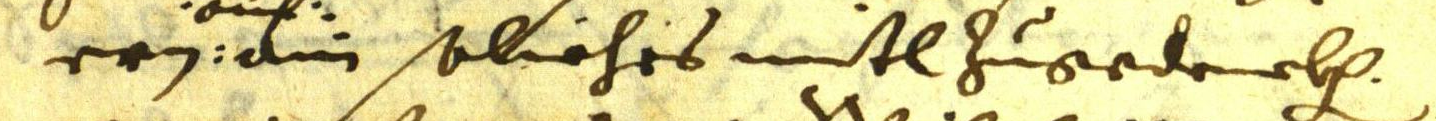ern ain soliches mitl Zūgedenckh.
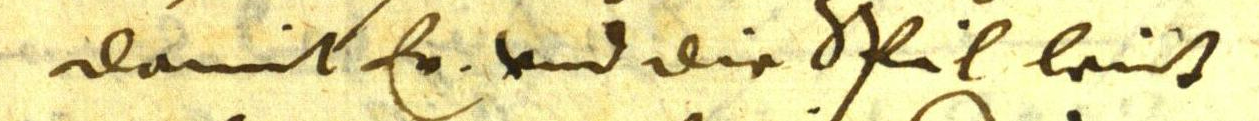damit Er. vnd die Spil leüt
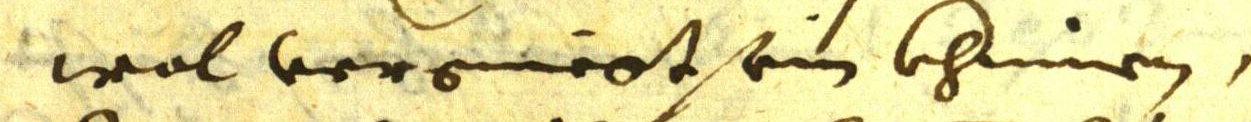wol vergniegt sein khūnen,
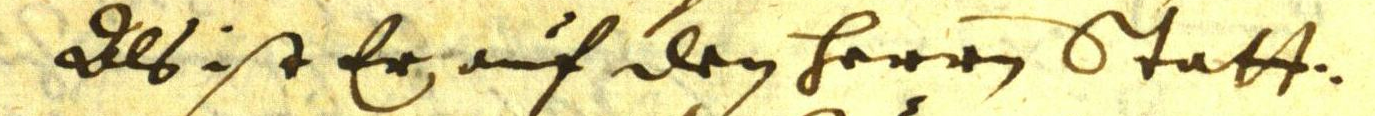Als ist Er aūf den herrn Statt¬
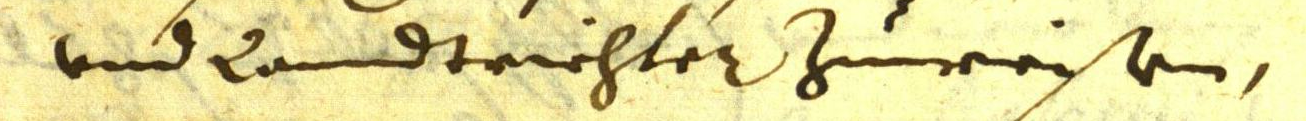vnd Lanndtrichter Zūweisen,
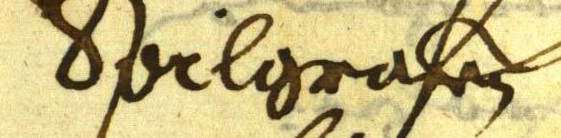Spilgrafen
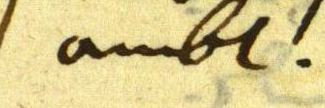ambt.
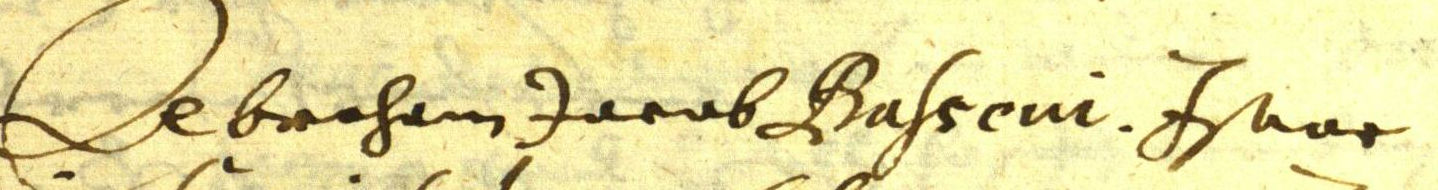Abraham Jacob Basseni. Isac
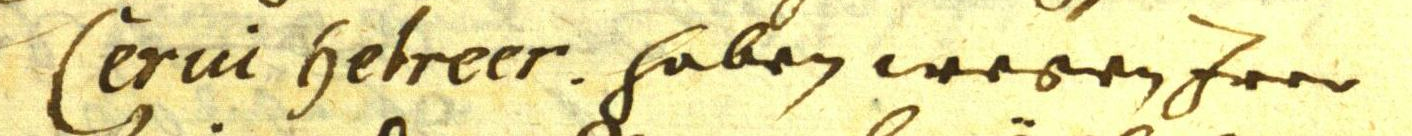Cerni hebreer. haben wegen Irer
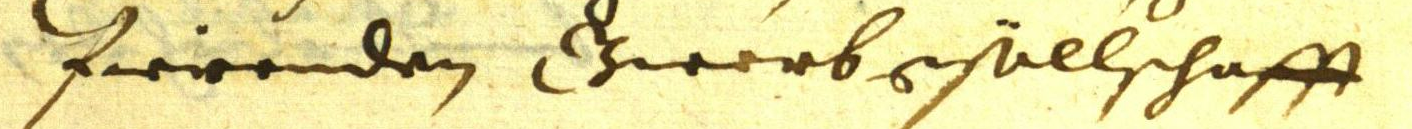fierenden Gwerb gsöllschafft
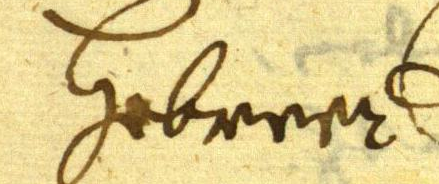Hebreer.
